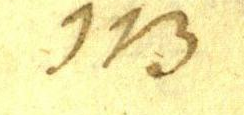113
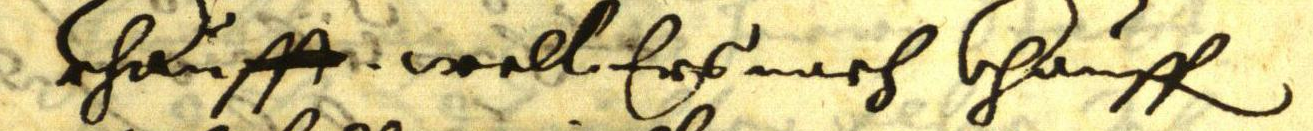khaūfft. well Ers noch khaūff
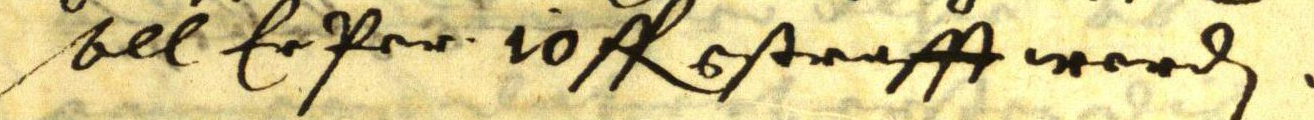soll Er Per 10 fl gstrafft werd.
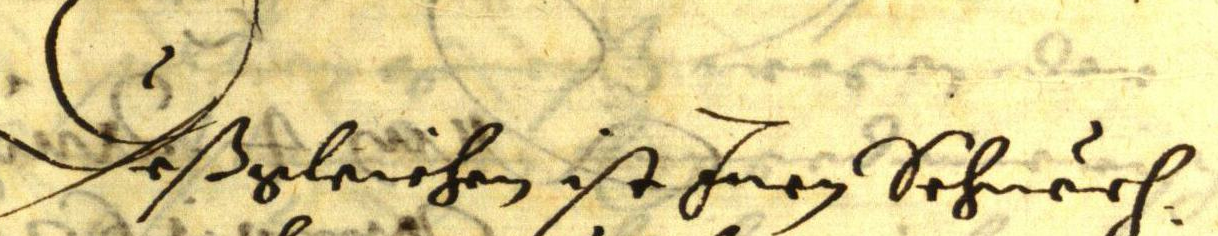Deßgleichen ist Inen Schūech¬
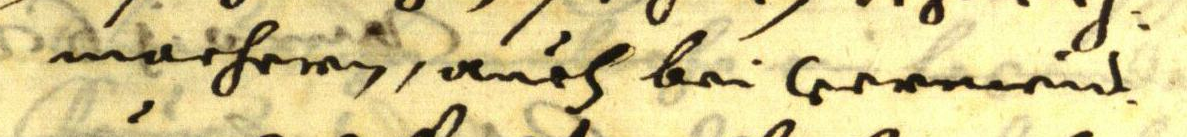machern, aūch bei vermeid¬
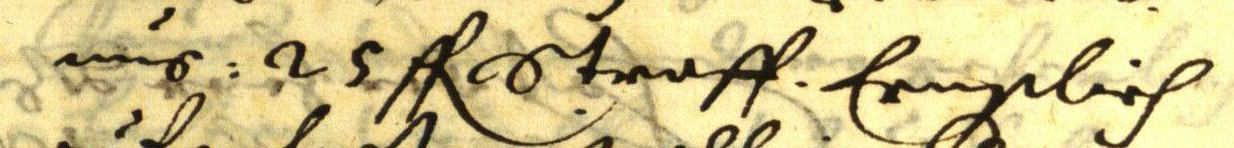ūng: 25 fl Straff. Ernstlich
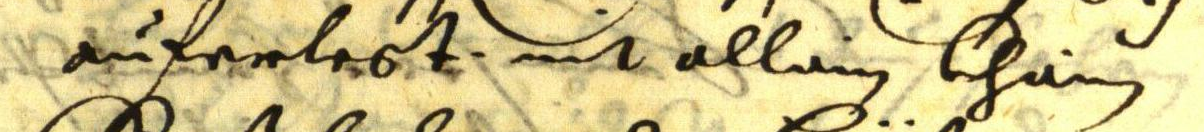aūferlegt. nit allain khain
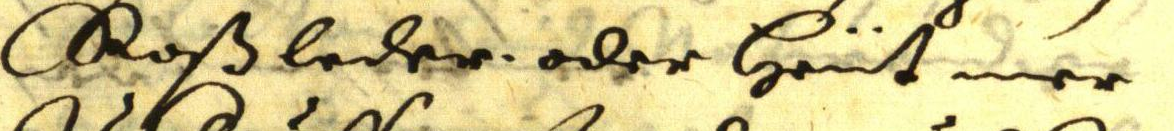Roßleder. oder Heüt mer
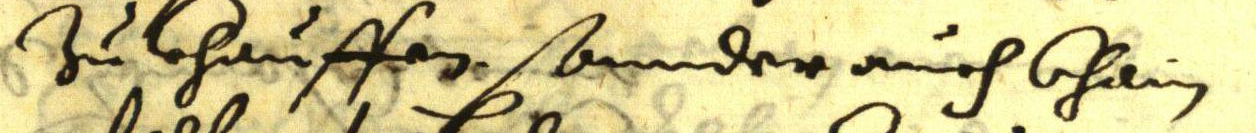Zū khaūffen. sonnder aūch khain
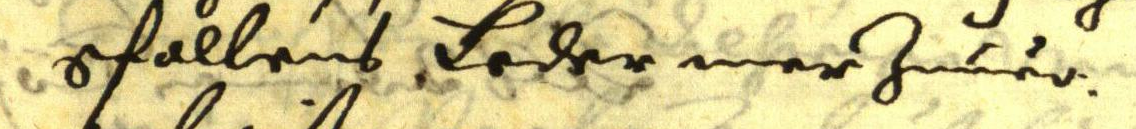gfallens Leder mer Zūūer¬
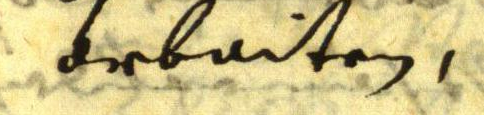arbaiten,
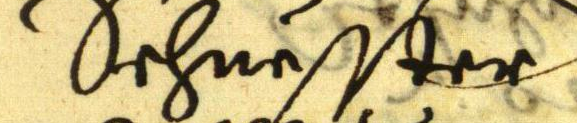Schūesster
